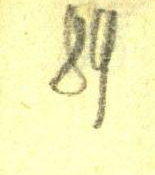89
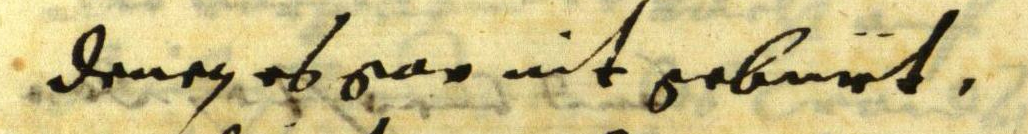denen es gar nit gebürt.
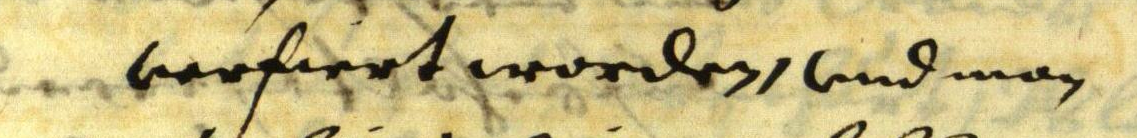verfiert worden, vnd man
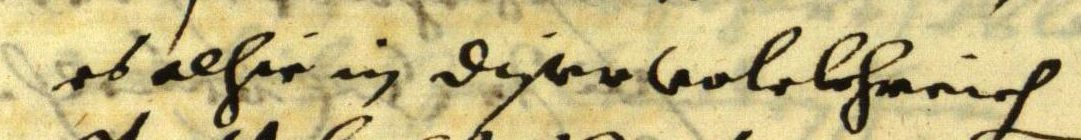es alhie in dieser volckhreich
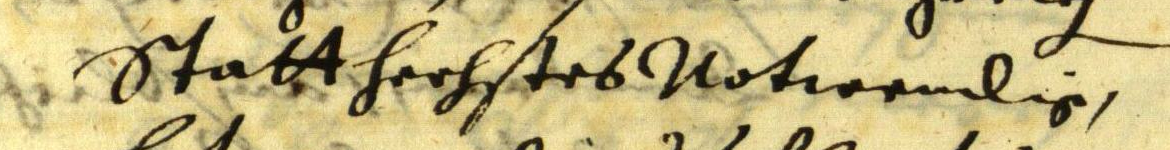Statt hechstes Notwendig,
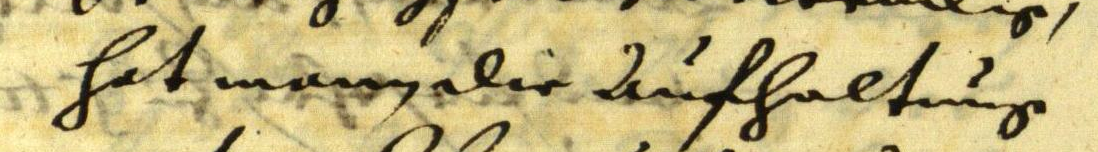hat mann die Aūfhaltūng
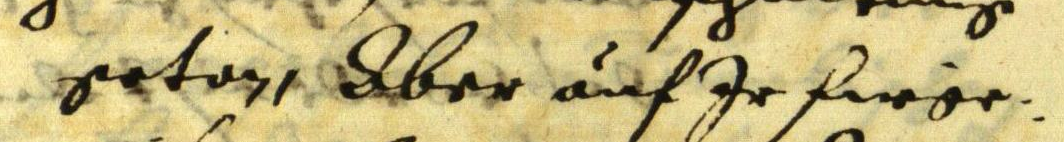getan, Aber aūf Ir firge¬
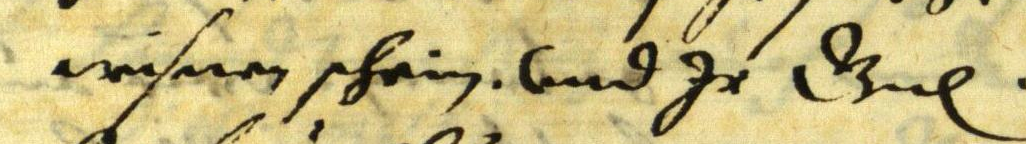wisnen schein. vnd Ir Gn:
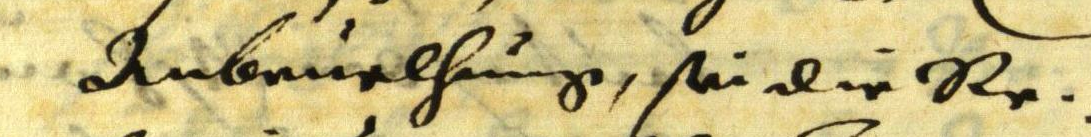Anbeūelhūng, sei die Re¬
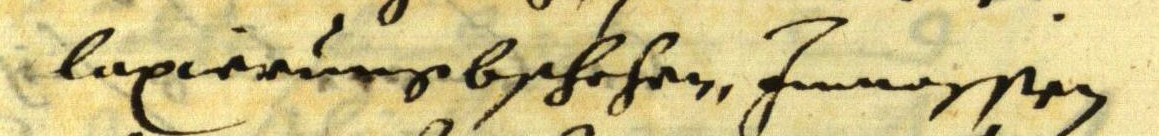laxierūng bschehen, Inmassen
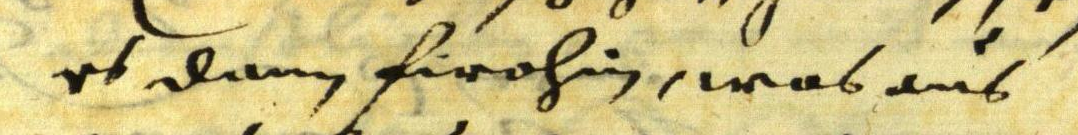es dann firohin, was aūs
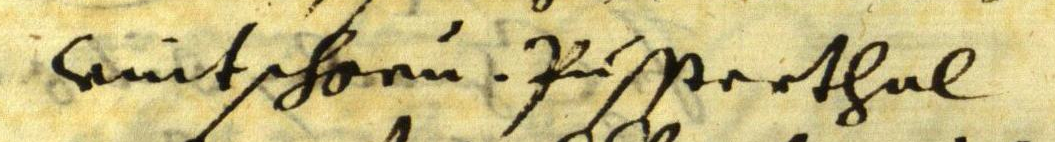vintschgeū. Pūssterthal
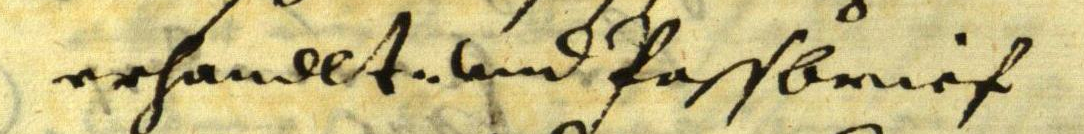erhandlt: vnd Passbrief
